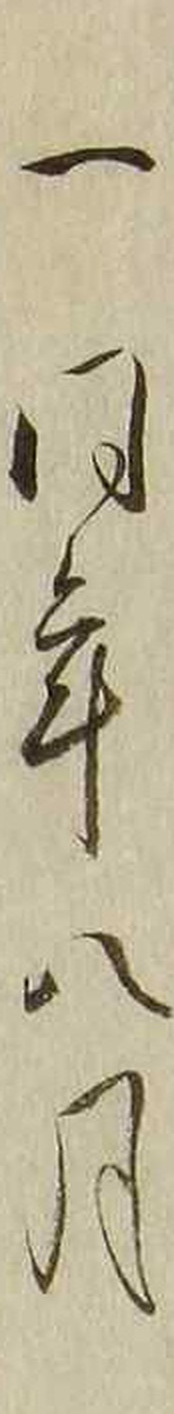一同年八月
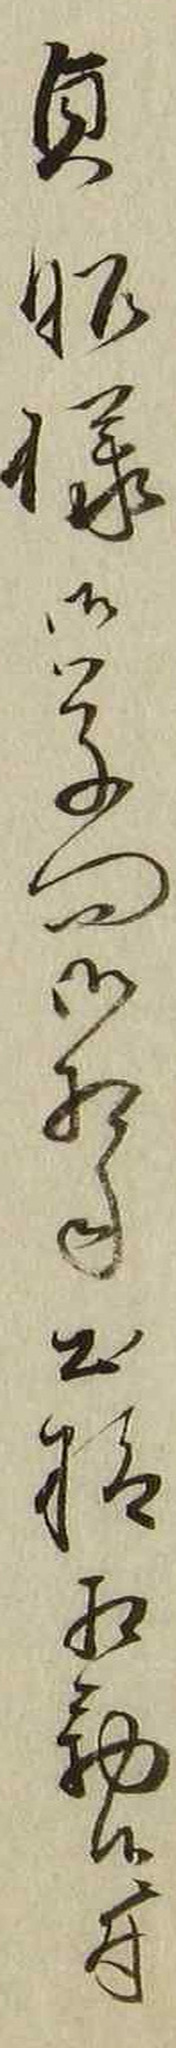貞昭様御学問御相手出精相勤候に付
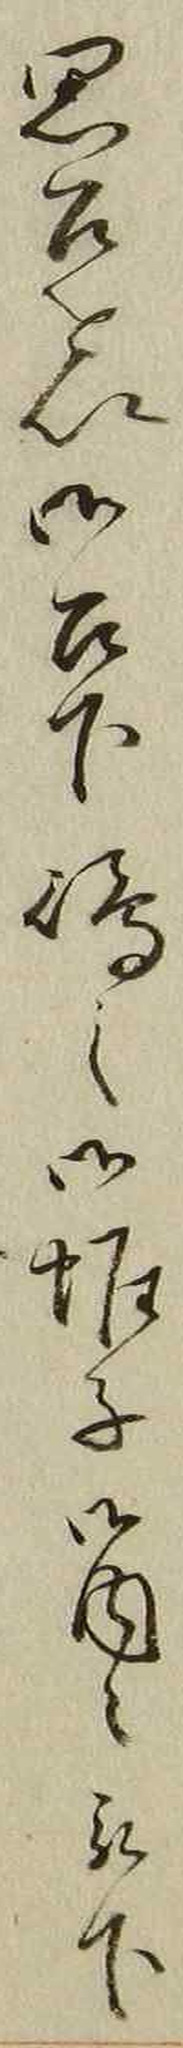思召を以御召下嶋之御帷子御内々被下
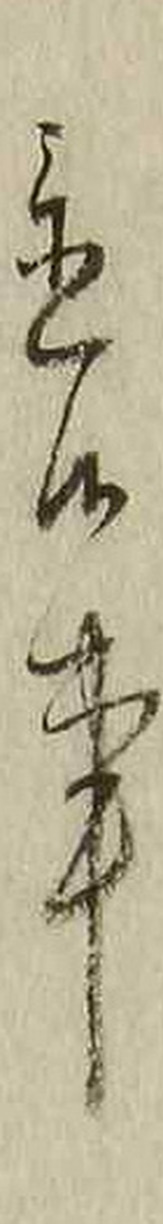置候事
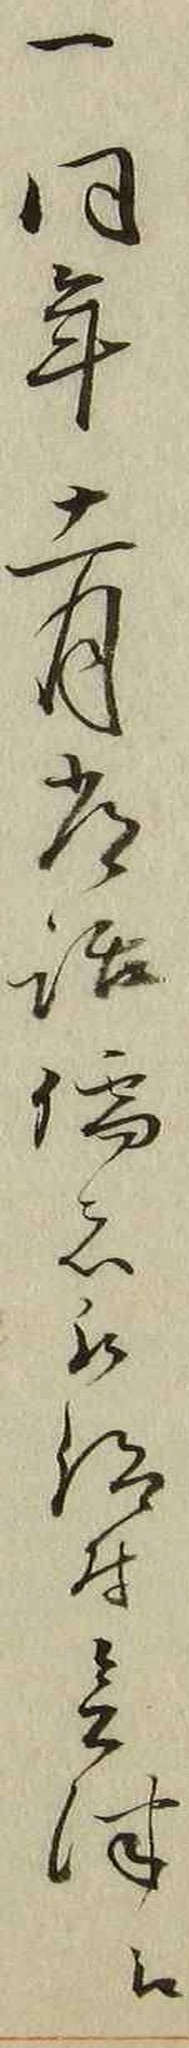一同年十一月常話儒者被仰付会津江
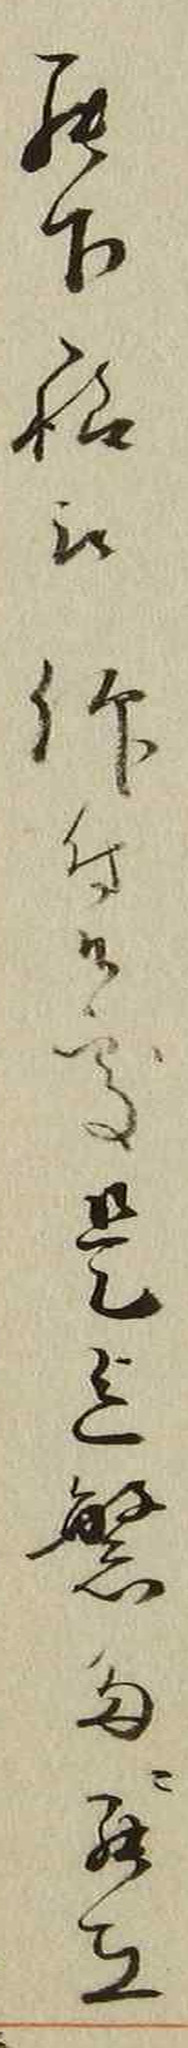罷下様被仰付候處是迄繁多に罷在
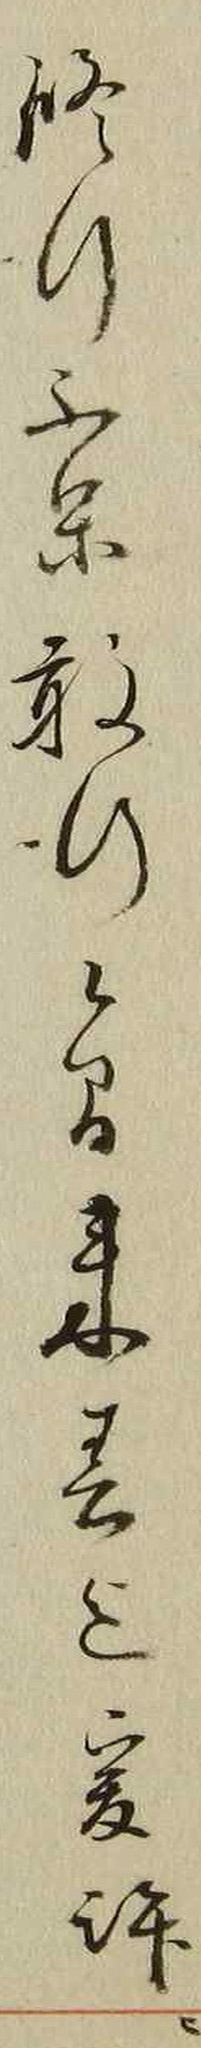修行不果敢行候間来春迄爰許に
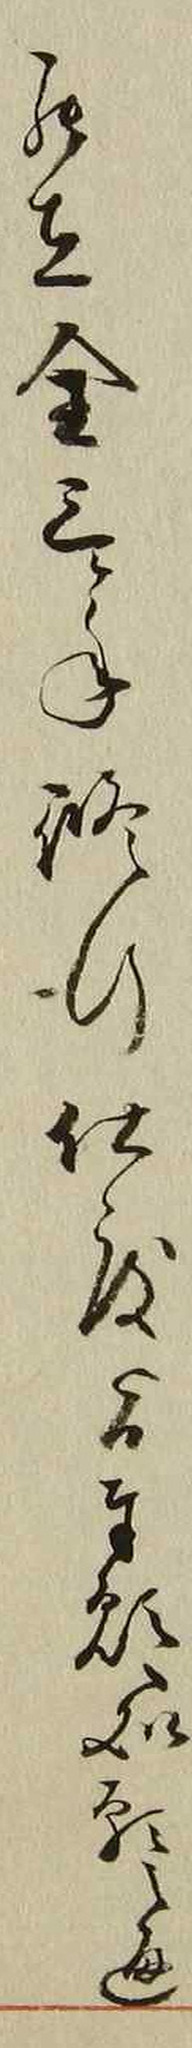罷在全三ケ年修行仕度旨奉願候処願之通
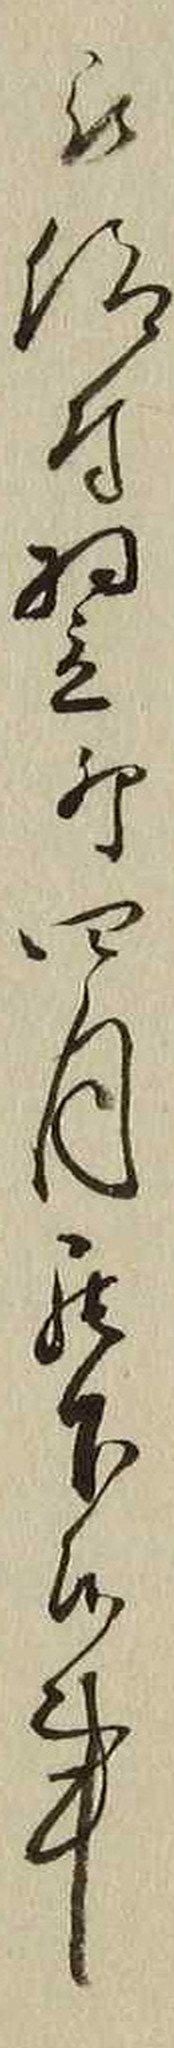被仰付翌卯四月罷下候事
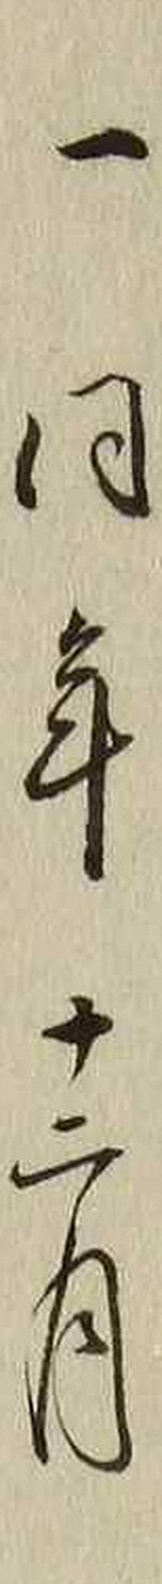一同年十二月
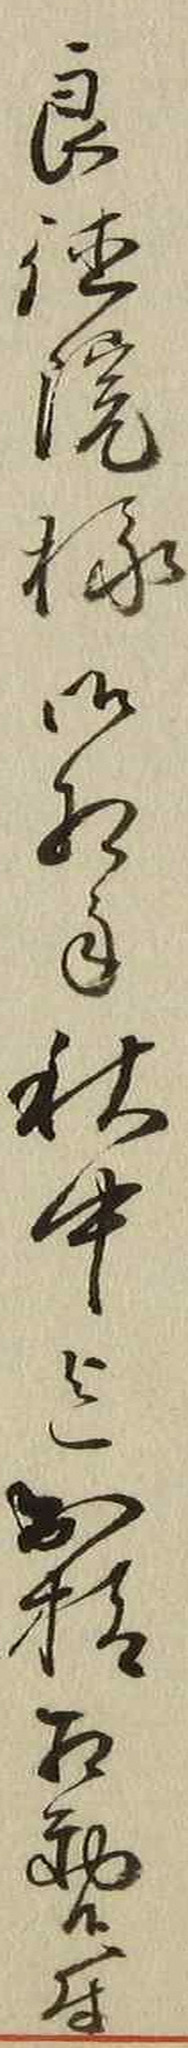良徳院様御相手秋中迄出精相勤候に付
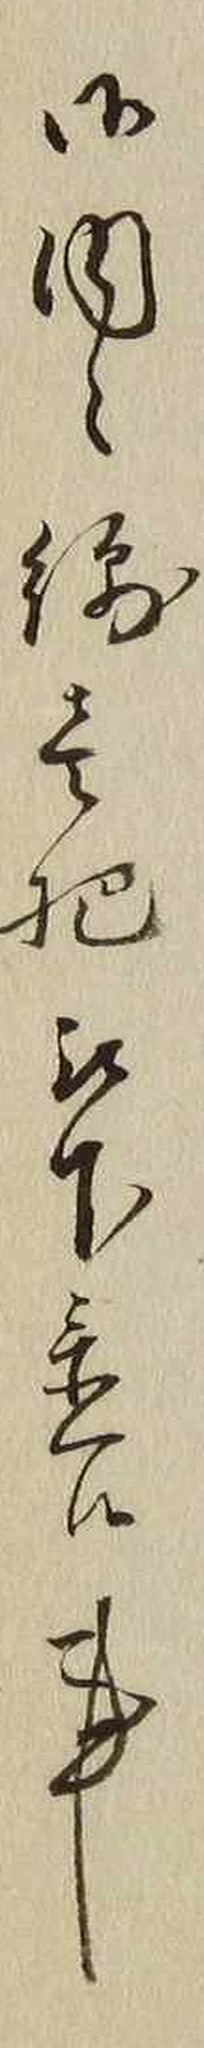御内々綿壱把被下置候事
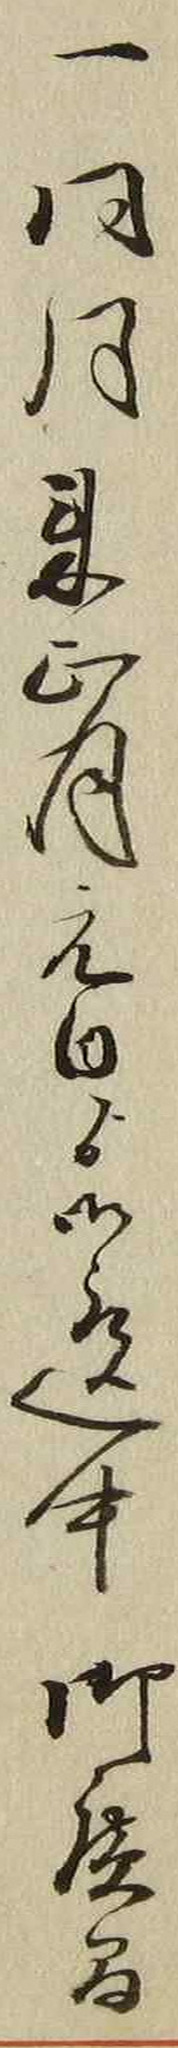一同月来正月元日ゟ御取込中御広間
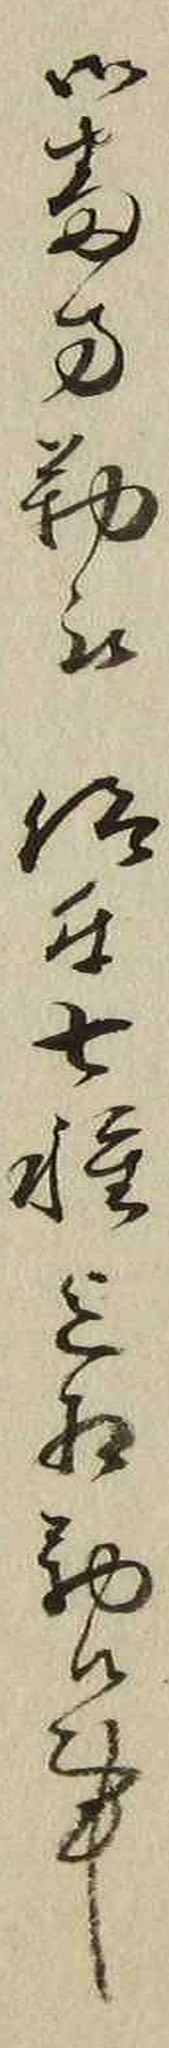御番方勤被仰付七種迄相勤候事
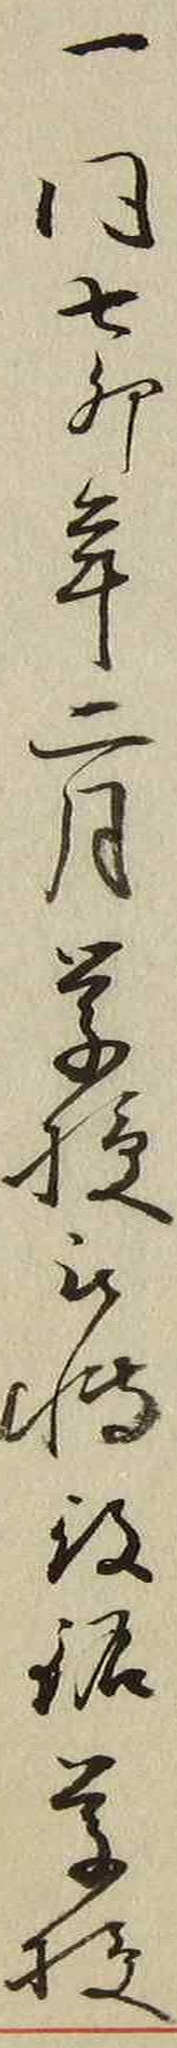一同七卯年二月学校被転役銘学校
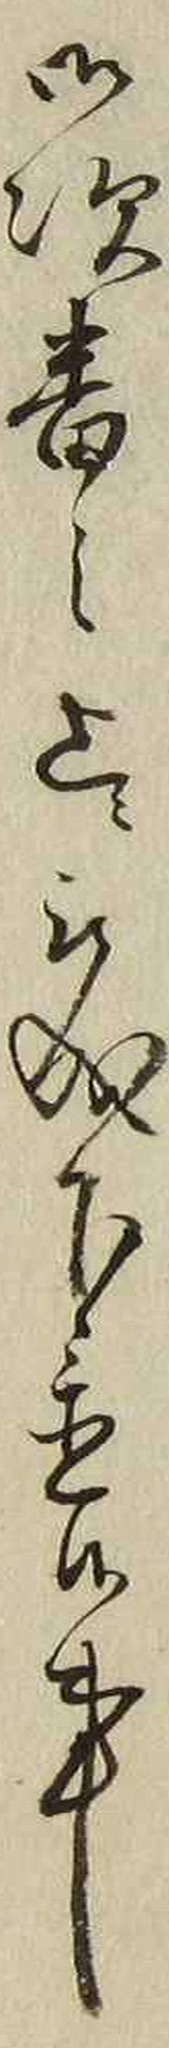御次番之上に被成下置候事
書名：諸士系譜　巻之3　い之部3
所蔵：会津若松市立会津図書館
